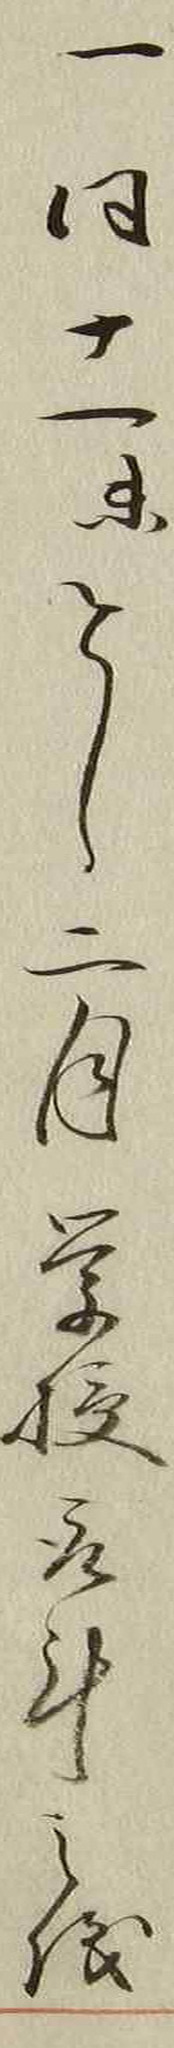一同十一未とし二月学校取計之儀
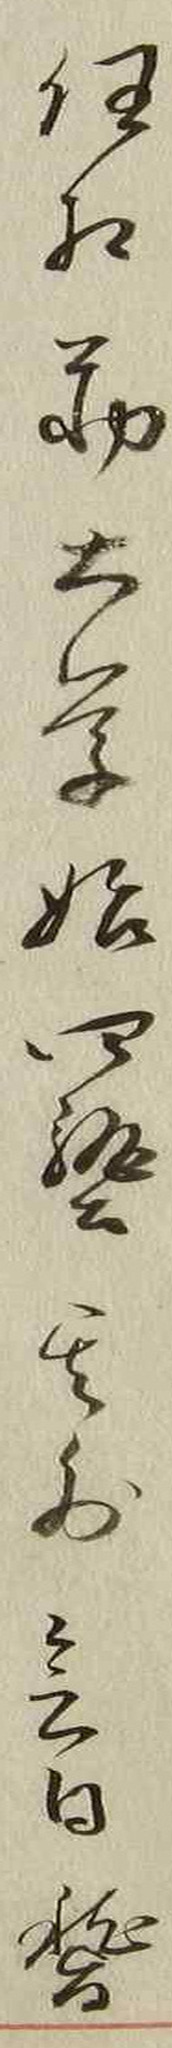任相勤大学始四塾其外会日稽
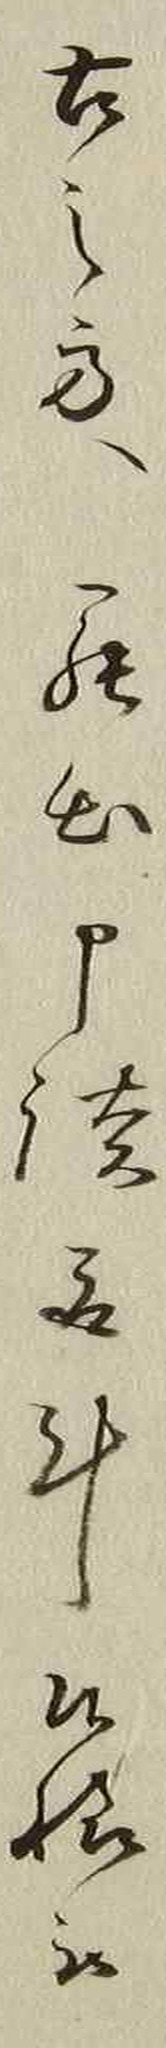古之方へ罷出申談取計候様被
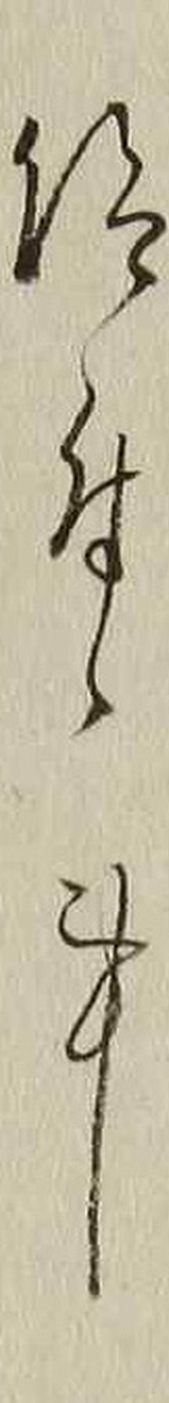仰付候事
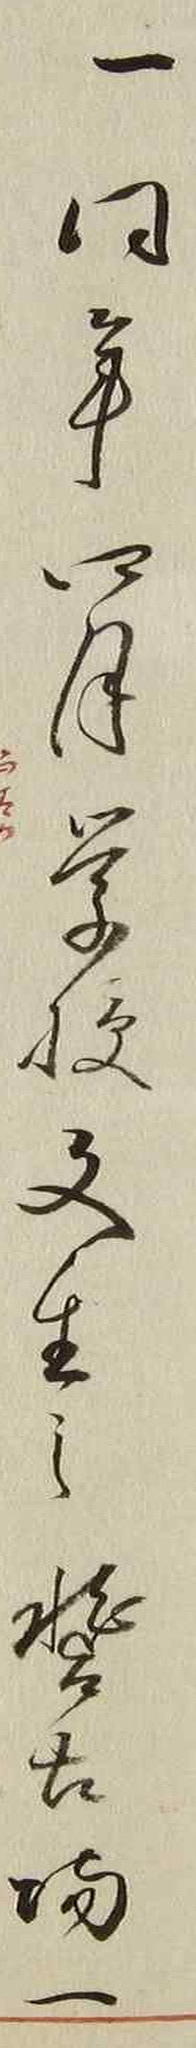一同年四月学校文生之稽古場一
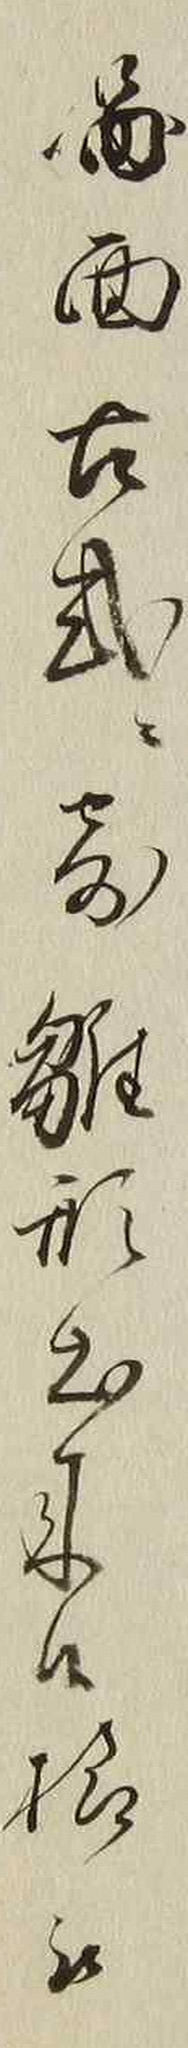図面古式ニ寄雛形出来候様被
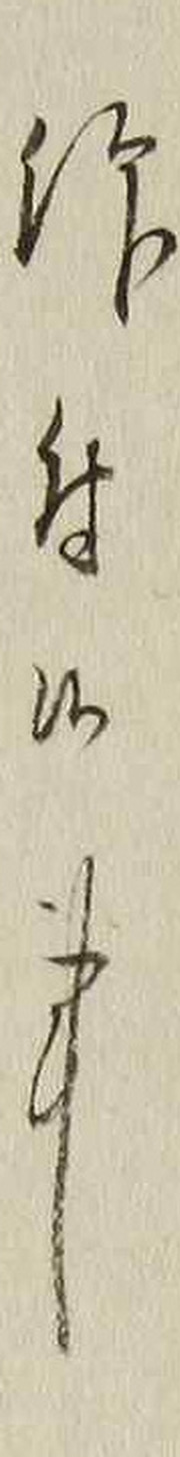仰付候事
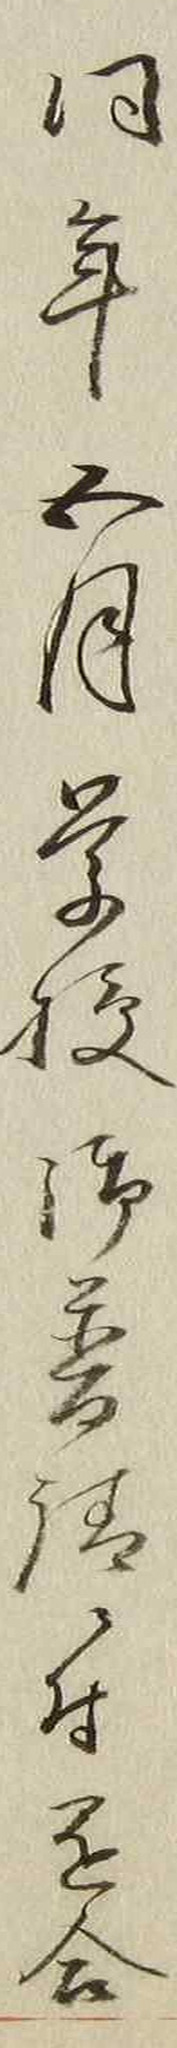一同年五月学校御普請ニ付懸合
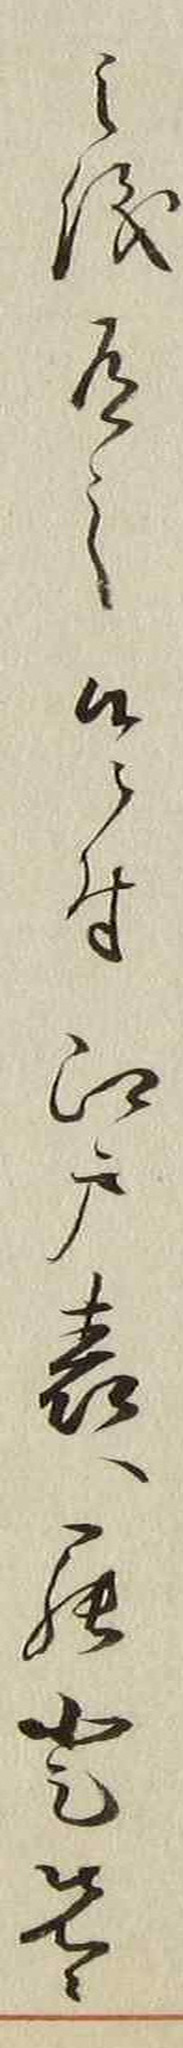之儀有之候ニ付江戸表へ罷登先々
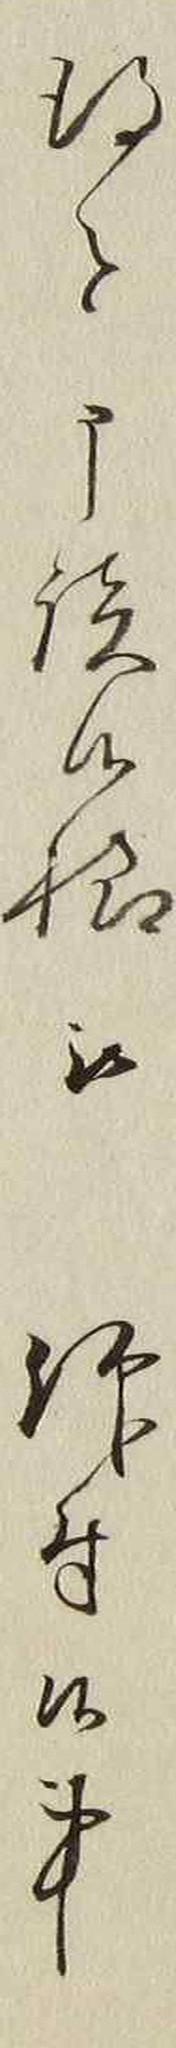得と申談候様被仰付候事
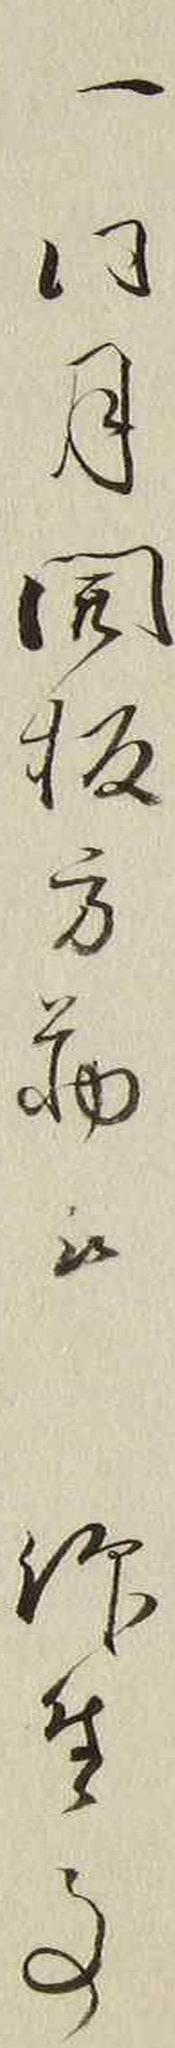一同月開板方勤被仰付候事
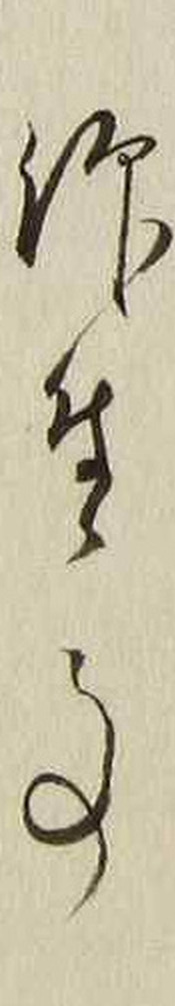仰付候事
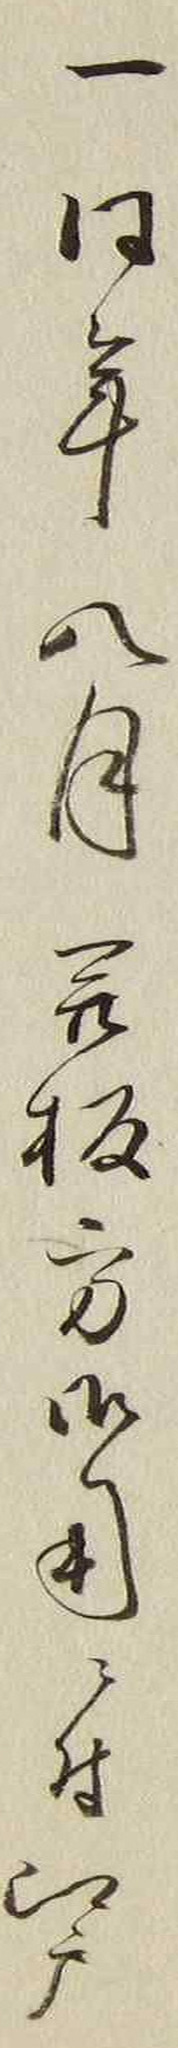一同年八月開板方御用ニ付江戸
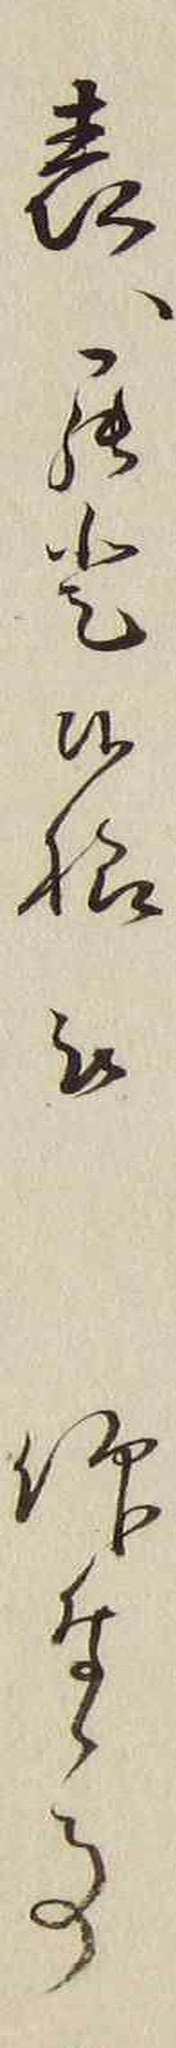表へ罷登候様被仰付候事
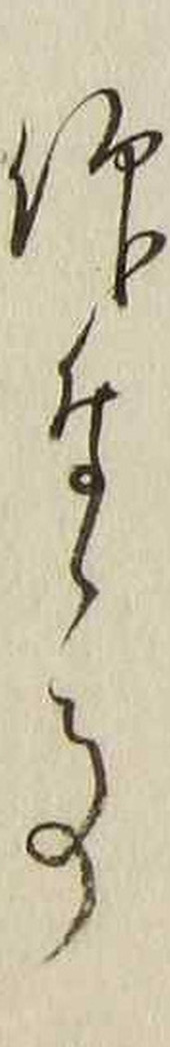仰付候事

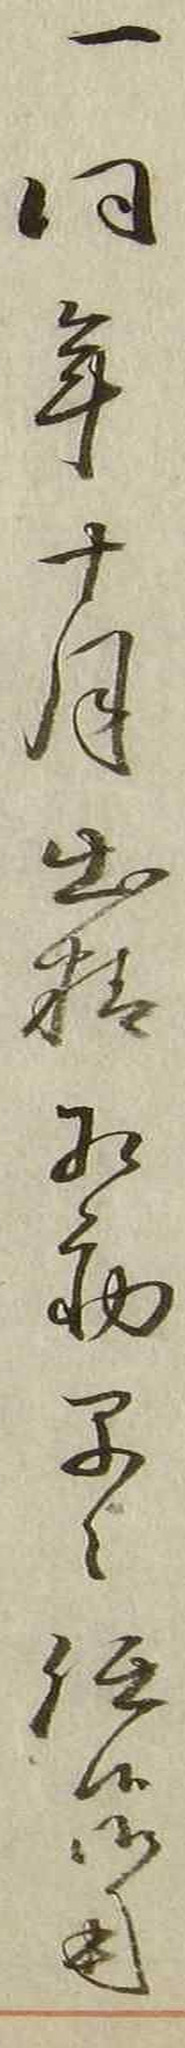一同年十月出精相勤早々任候御用
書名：諸士系譜　巻之28　い之部28
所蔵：会津若松市立会津図書館
